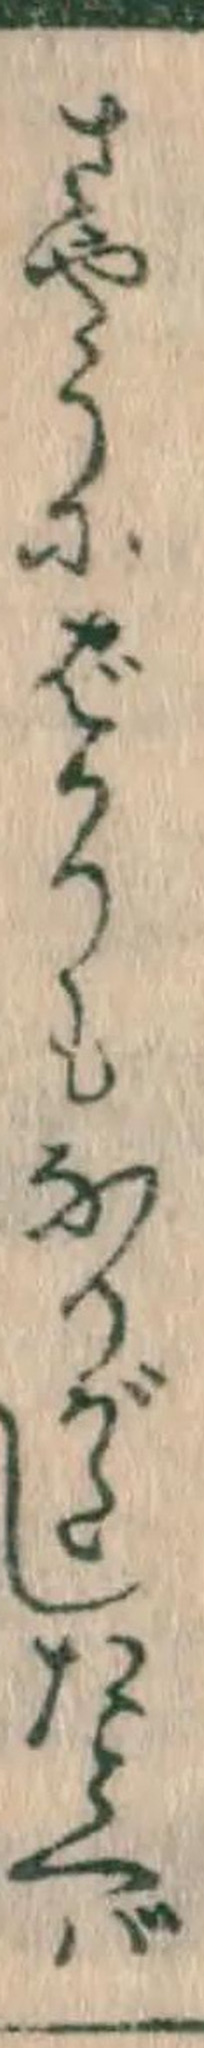さやうにばかりもなりがたしたとへば
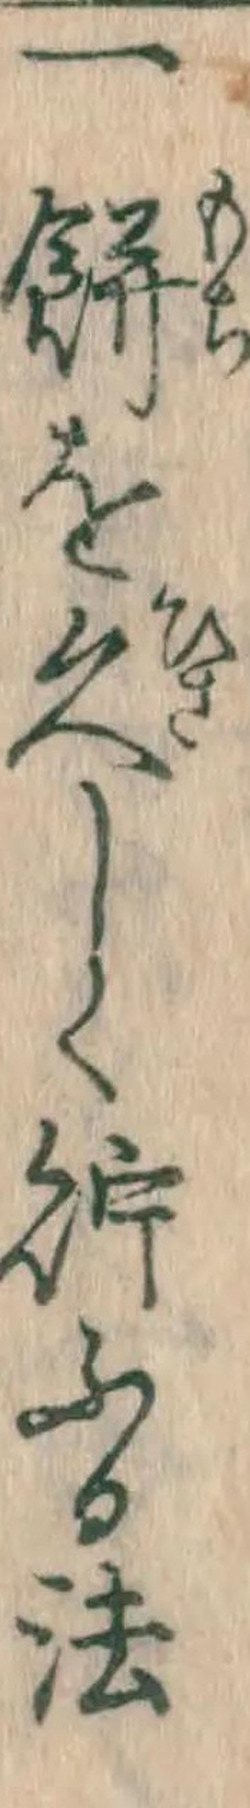一餅を久しく貯ふる法
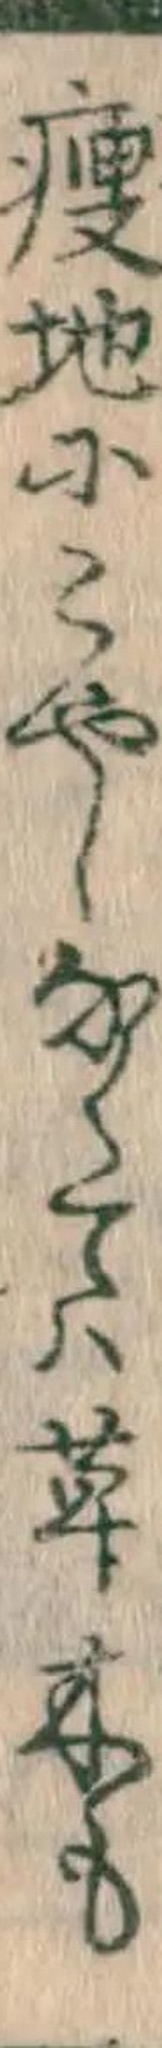痩地にこやしなくては草木も
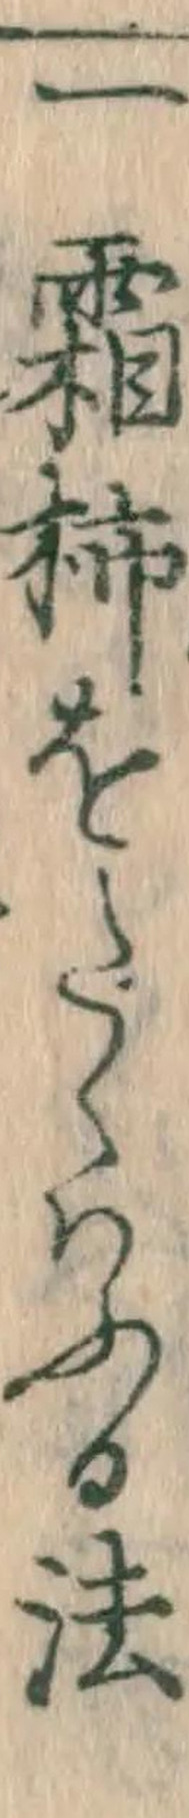一霜柿をたくはふる法
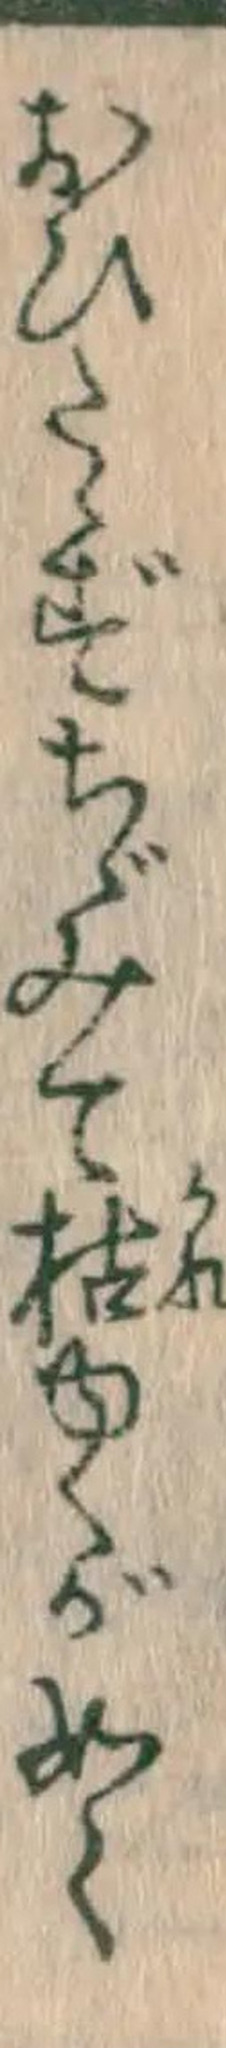おひたゝずちゞみて枯ゆくが如く
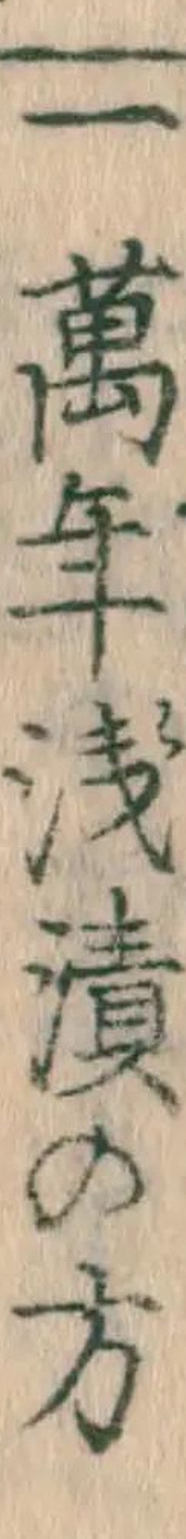一万年浅漬の方
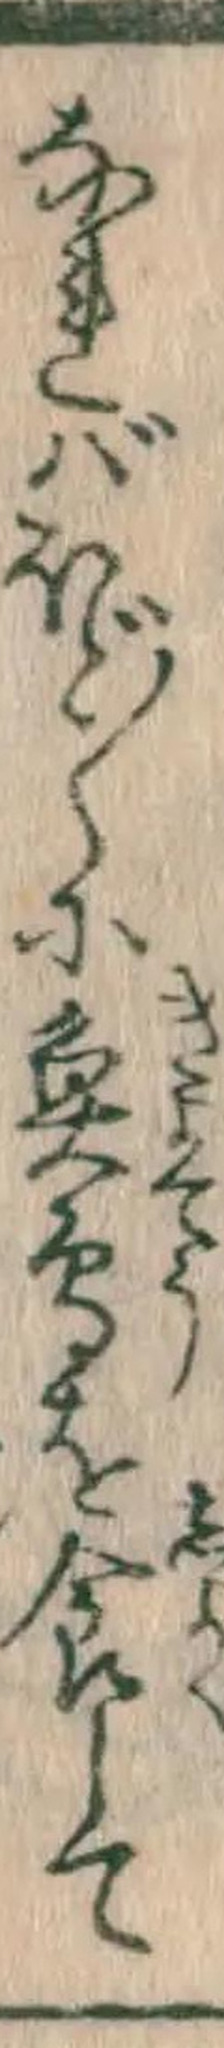なればほど〳〵に魚鳥を食して
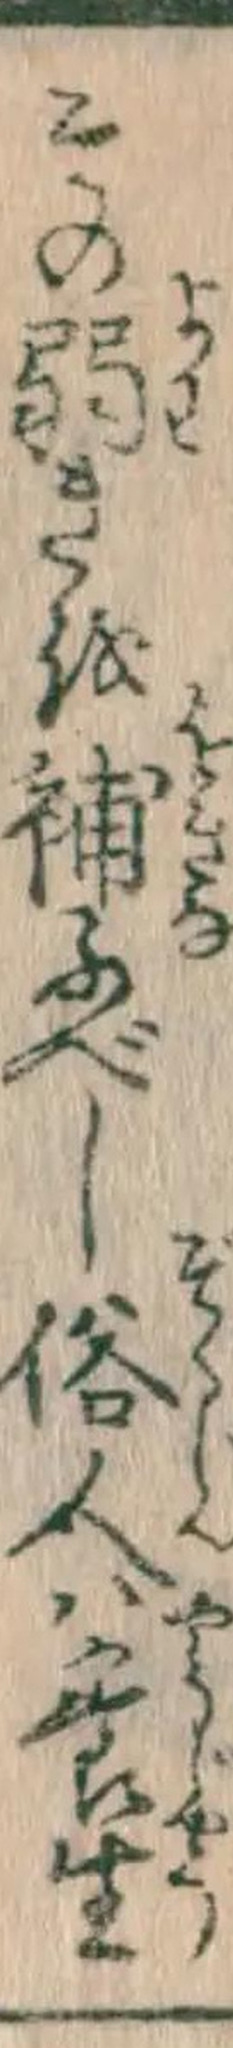その弱きを補ふべし俗人は養生
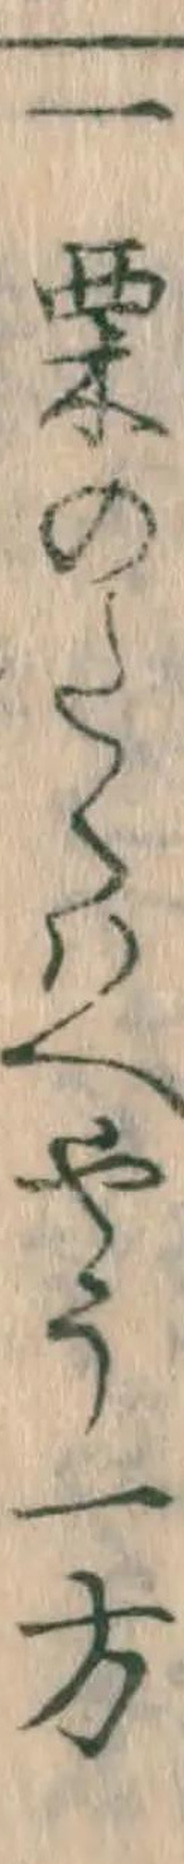一栗のたくはへやう一方
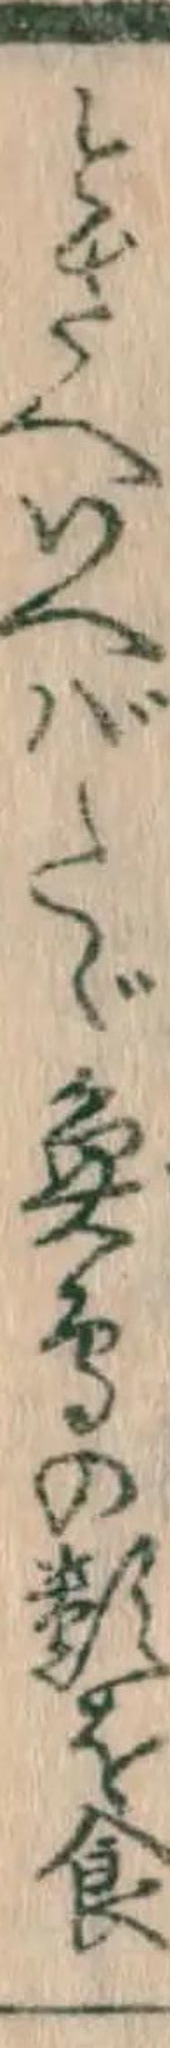とさへいへばたゞ魚鳥の類を食
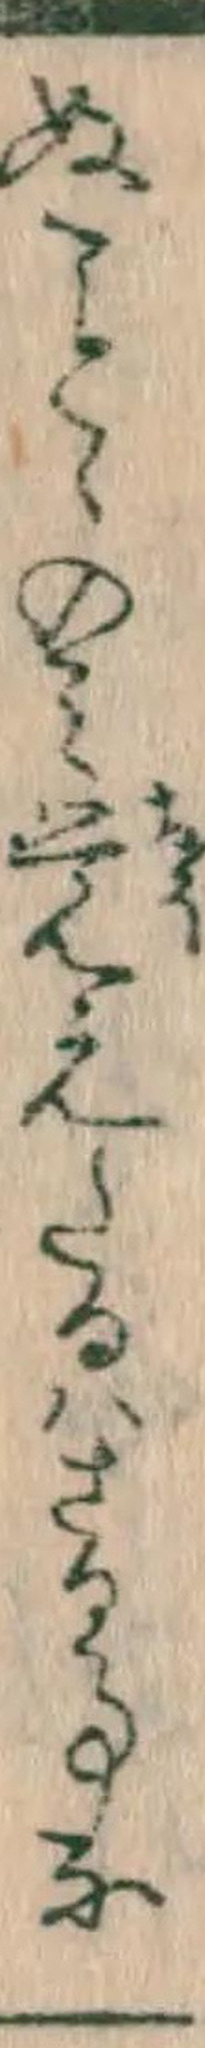ぬことゝのみ覚えたるはさる事な
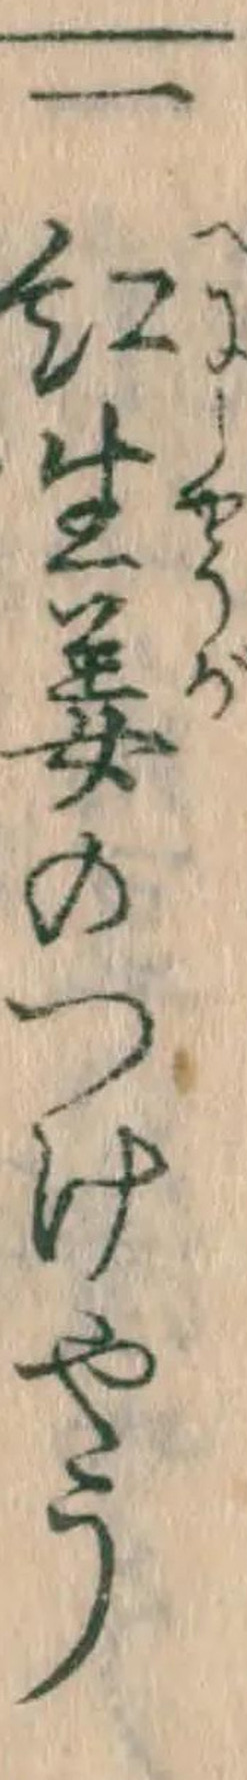一紅生姜のつけやう
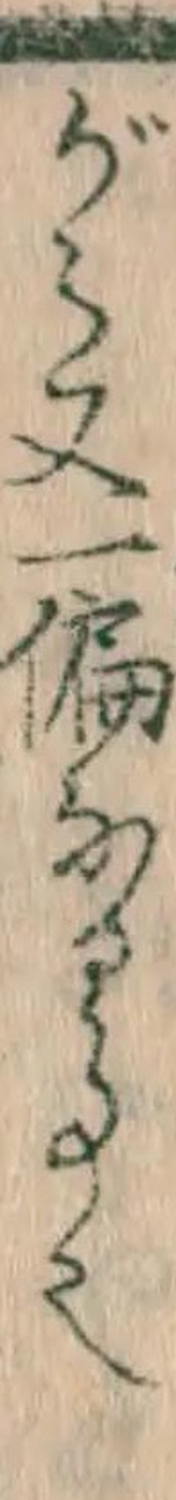がら又一偏なる事也
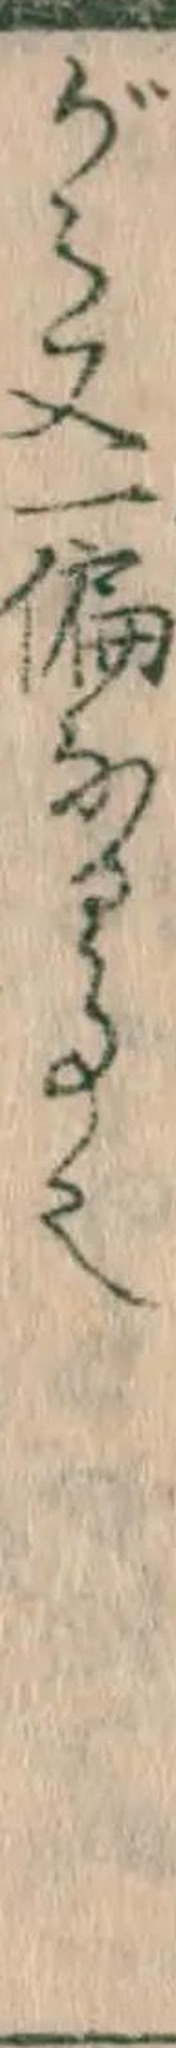がら又一偏なる事也
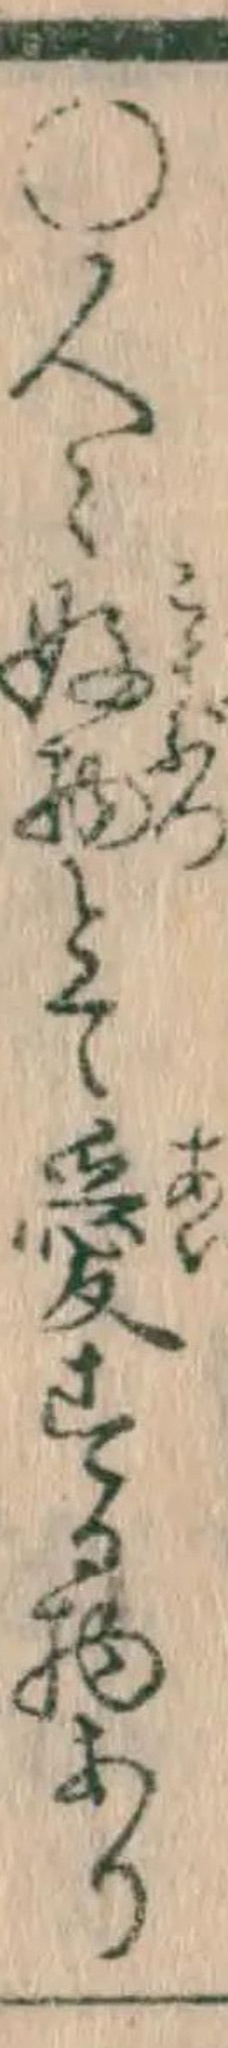○人々好物とて愛する物あり
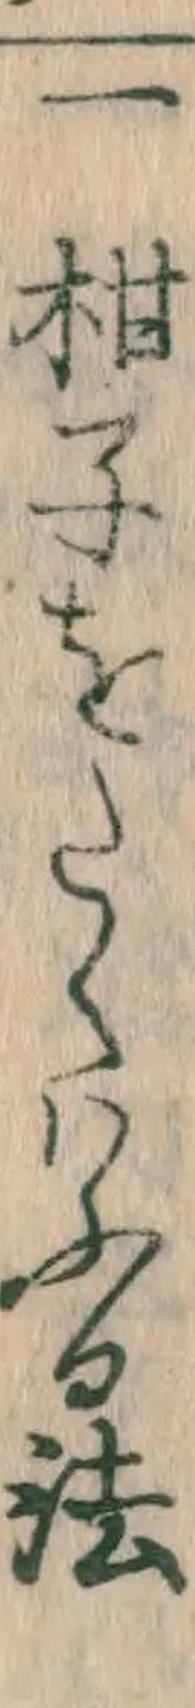一柑子をたくはふる法
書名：広益秘事大全 3巻. [1]
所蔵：国立国会図書館 National Diet Library, JAPAN
